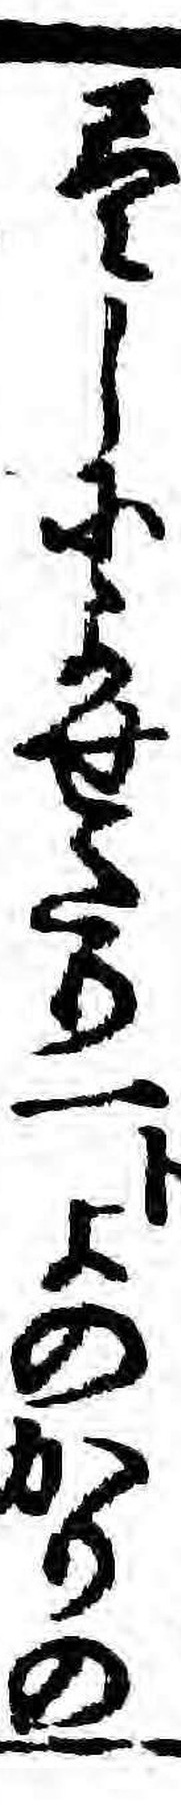尽しによせたり一トよのかりの
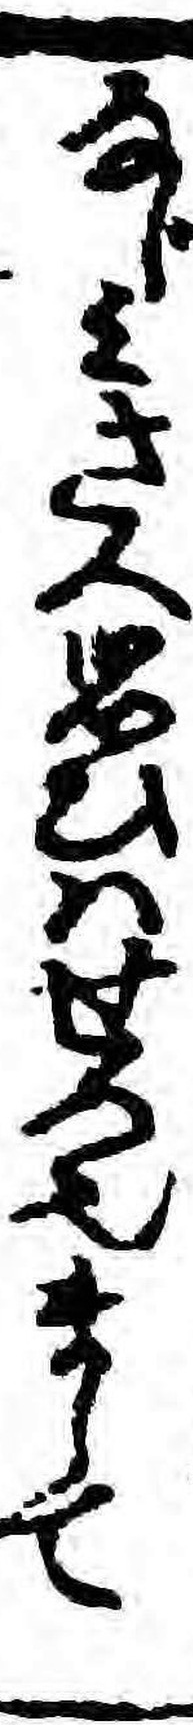なじみさへ思ひはせつ也まして
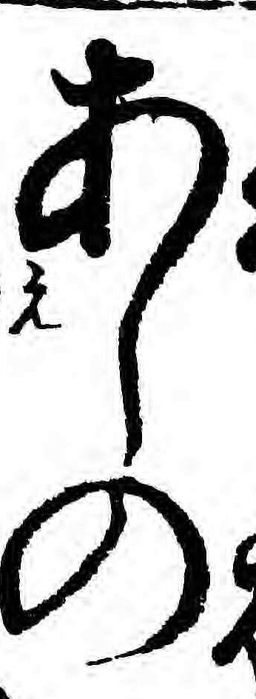あしの
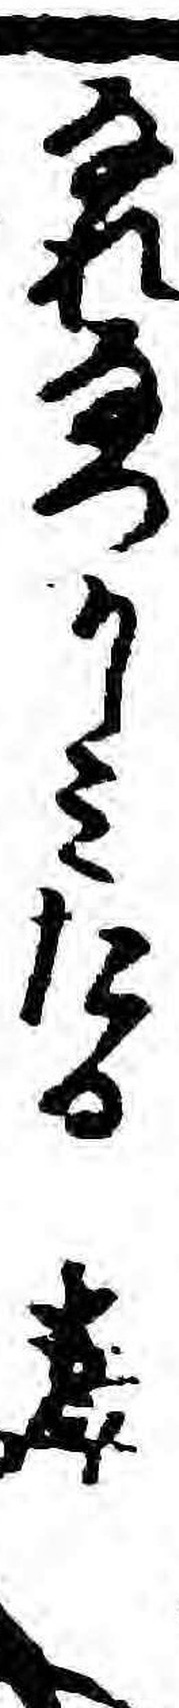なれなつかしみたる
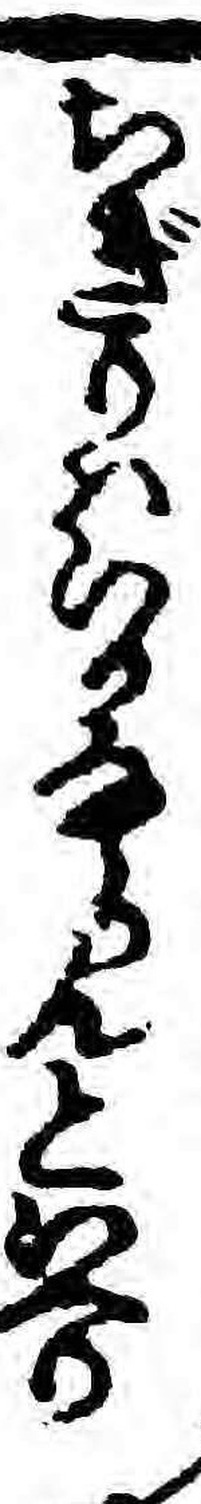ちぎりはいつならんといへり
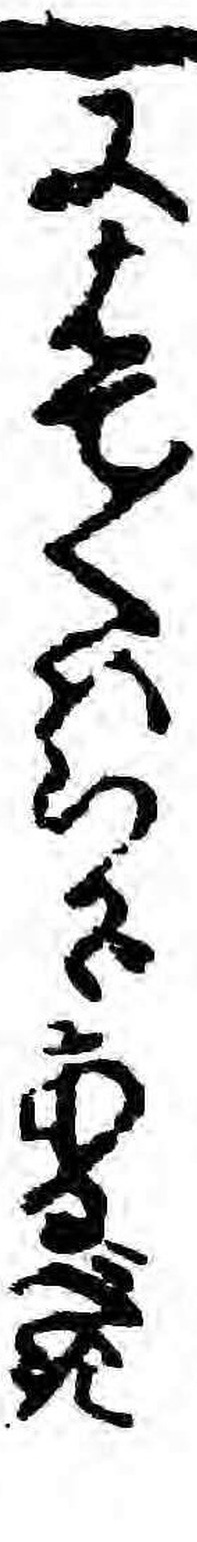又はて〳〵はいかゞあるべき
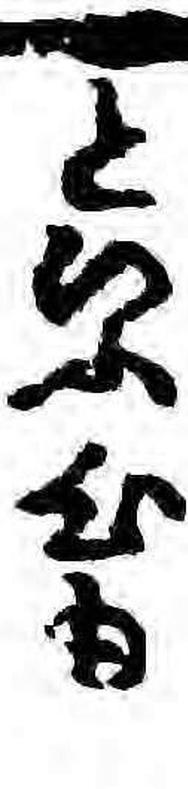といふ心も
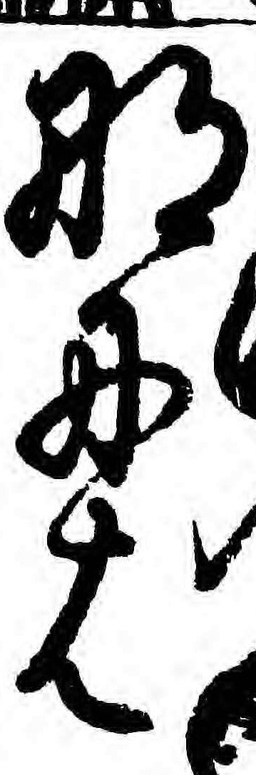なには
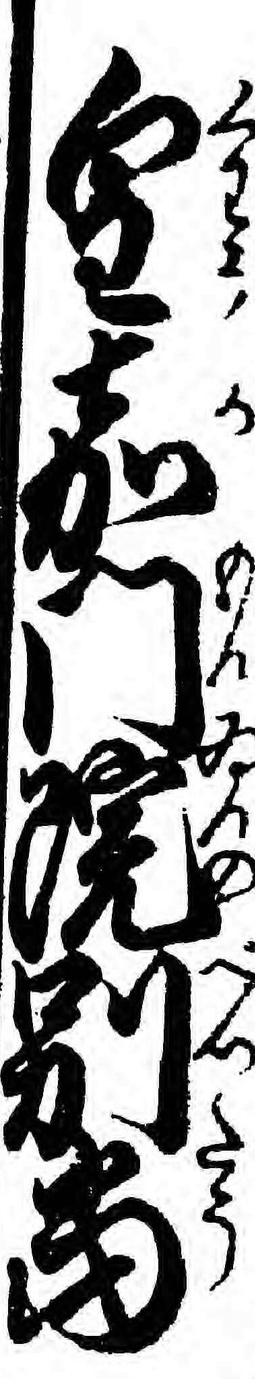皇嘉門院別当
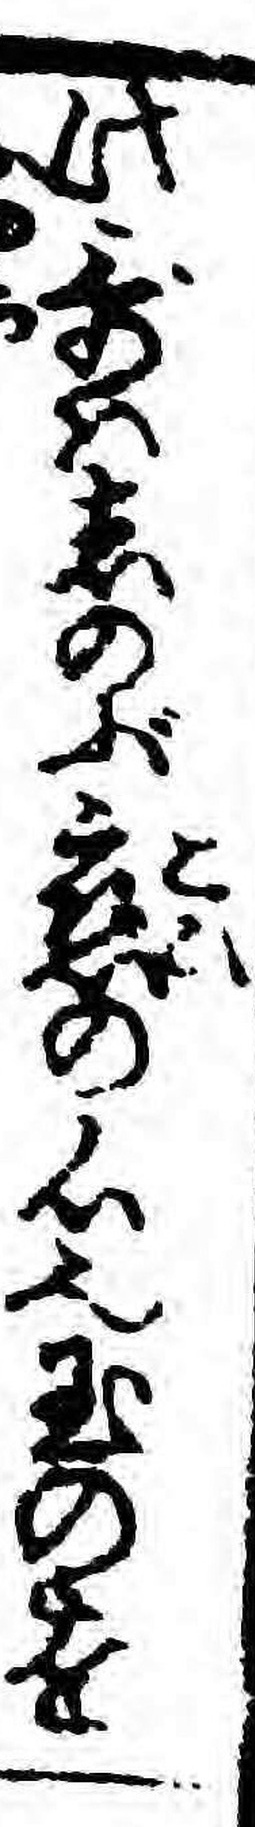此哥はしのぶ恋の心也玉のを
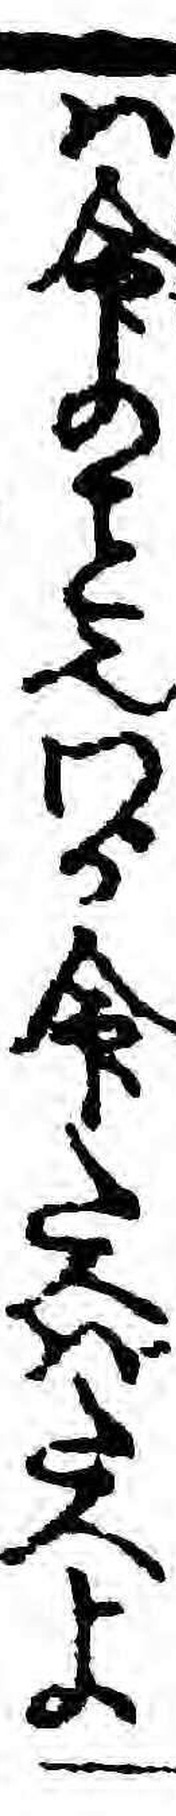は命のこと也わが命たへばたへよ
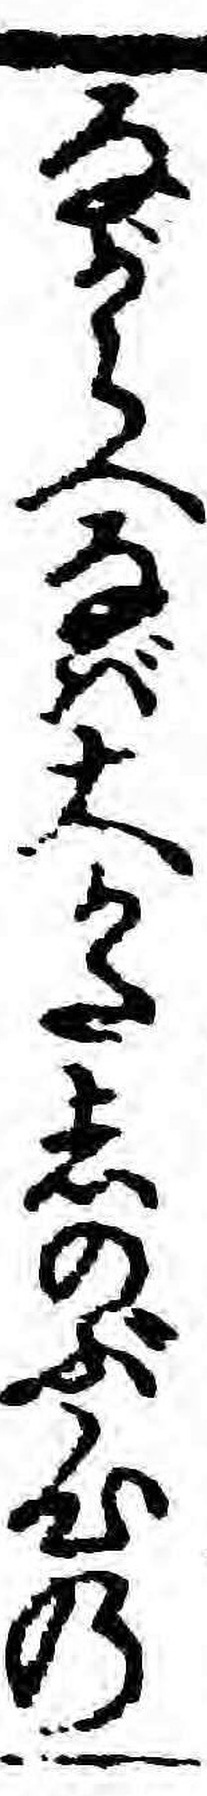ながらへなば大かたしのぶ心の
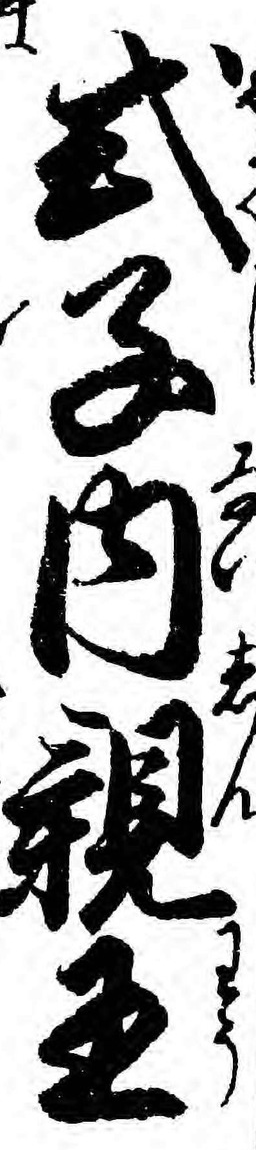式子内親王
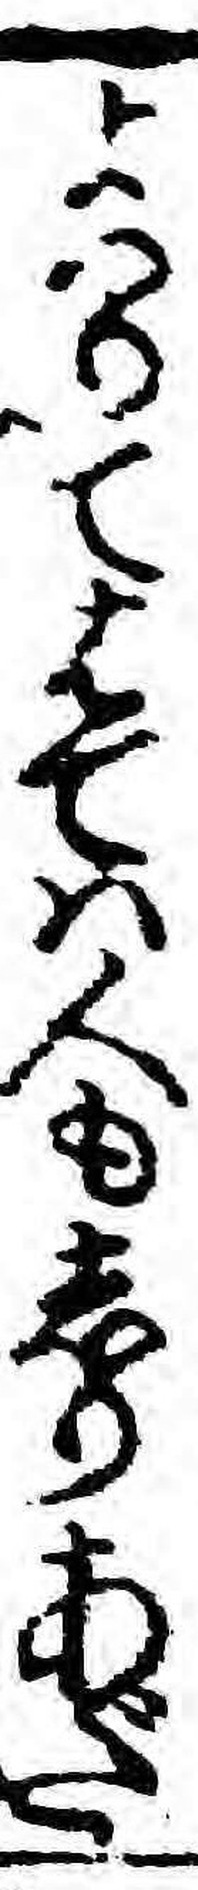よはりてはては人もしりあだ
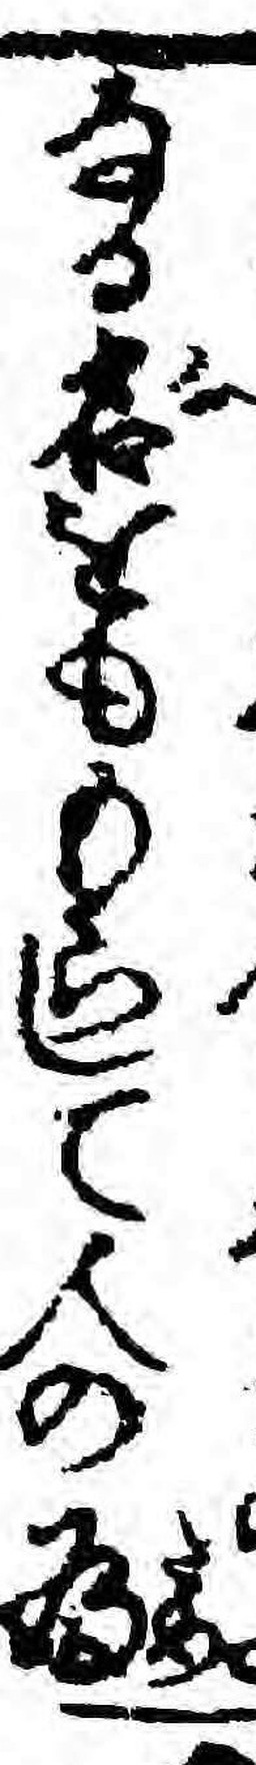なる名をももらして人の為
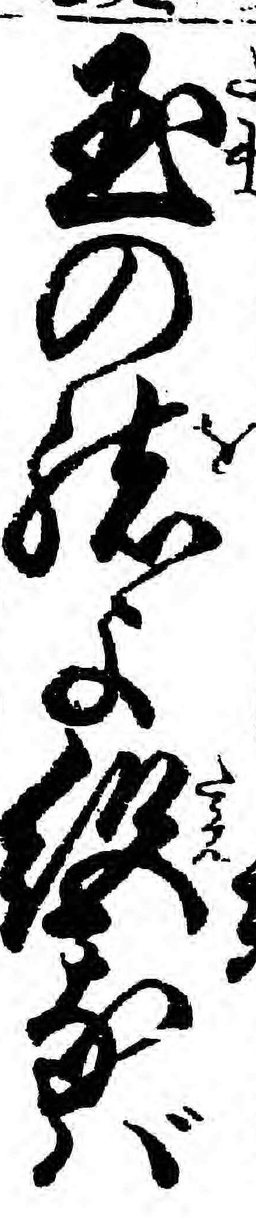玉の緒よ絶なば
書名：頭書和歌注譯／壽賀多百人一首小倉錦
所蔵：国文学研究資料館
